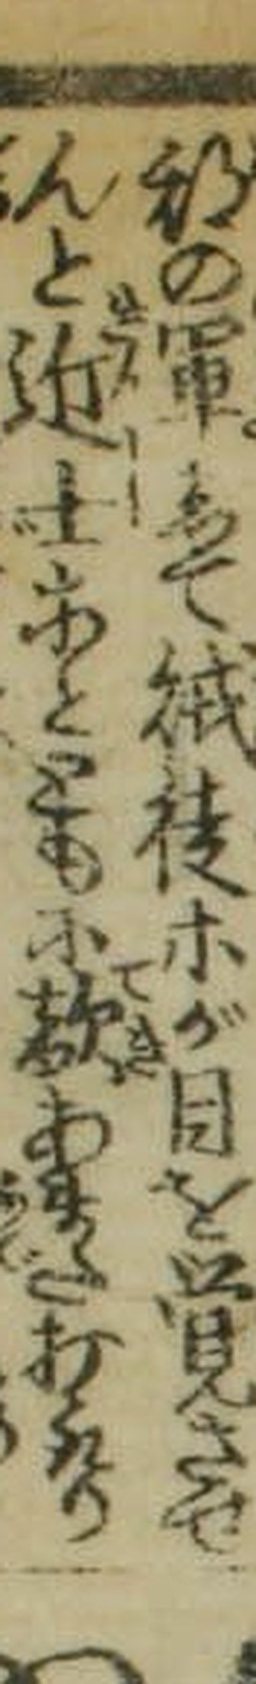んと近士等とともに敵あまた打取り
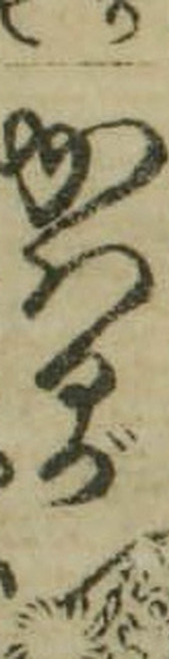かはるが
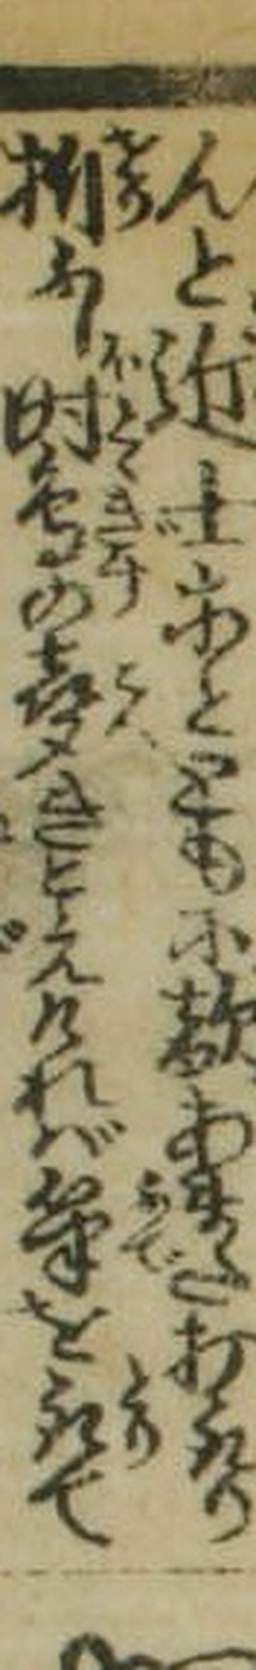折ふし時鳥の声きこえければ筆を取て
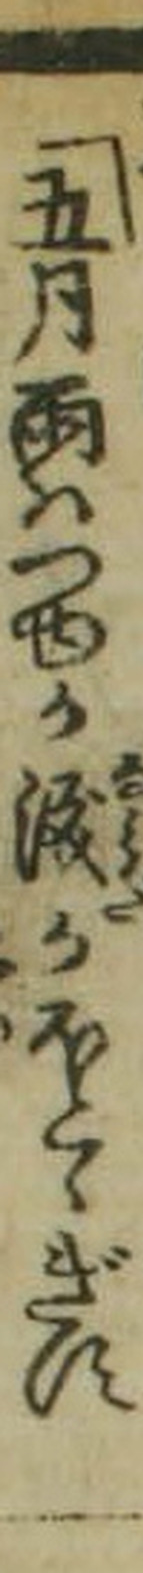〽五月雨はつゆか涙かほとゝぎす
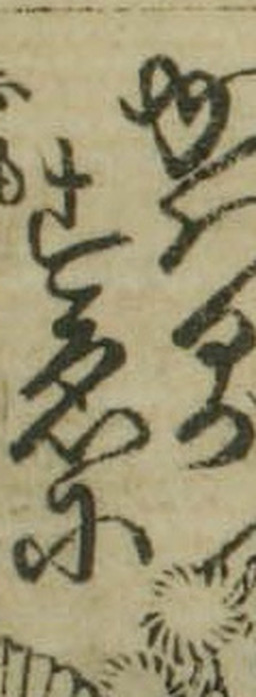すゑに
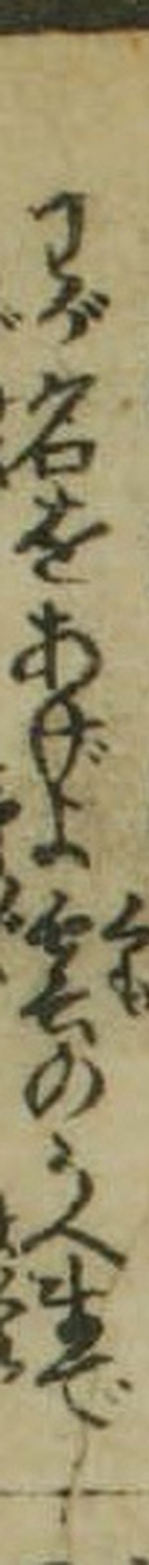わが名をあげよ雲のうへまで
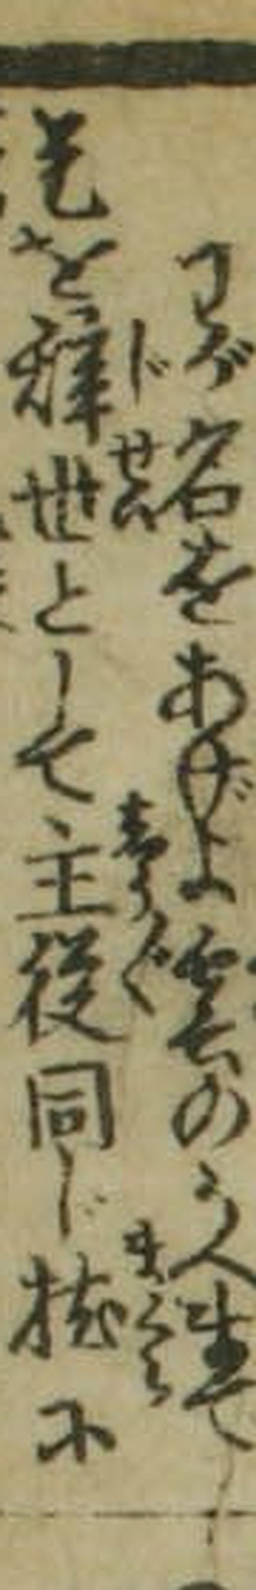是を辞世として主従同じ枕に
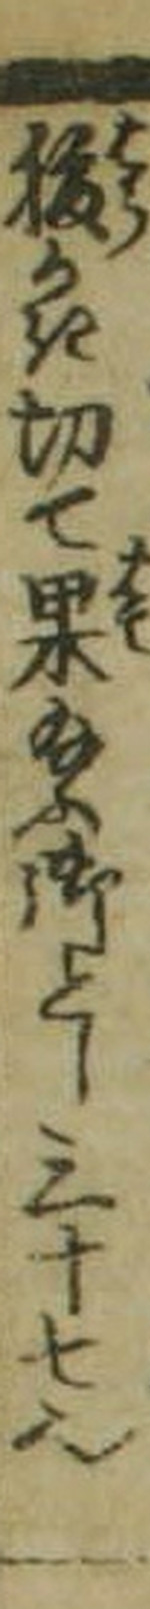腹かき切て果給ふ御とし三十七也
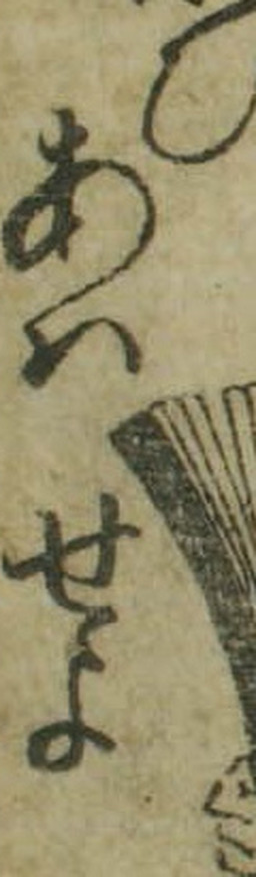あはせよ

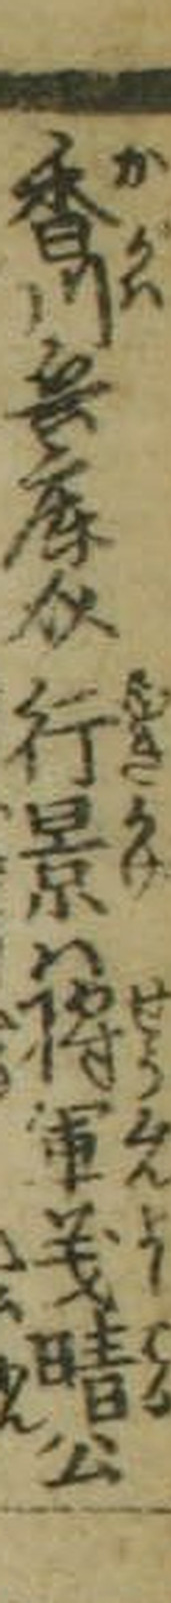香川兵庫介行景は将軍義晴公
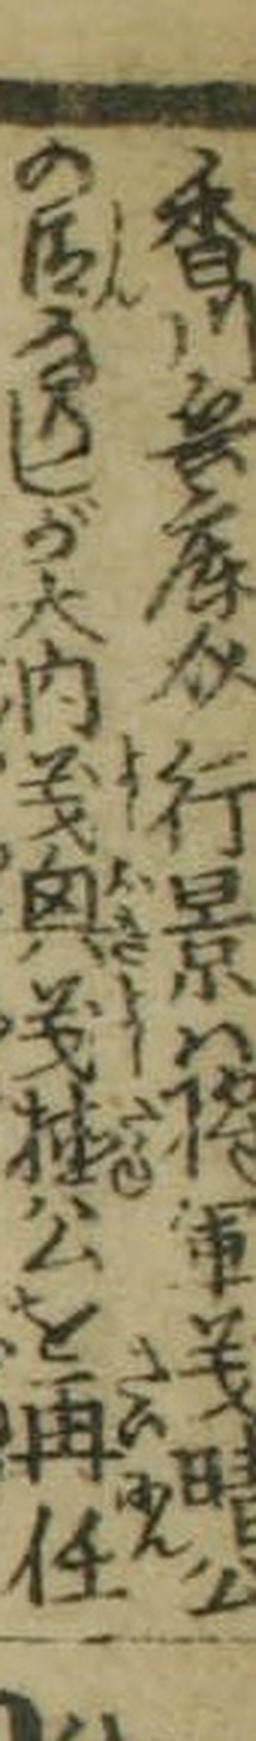の臣なりしが大内義興義種公を再任
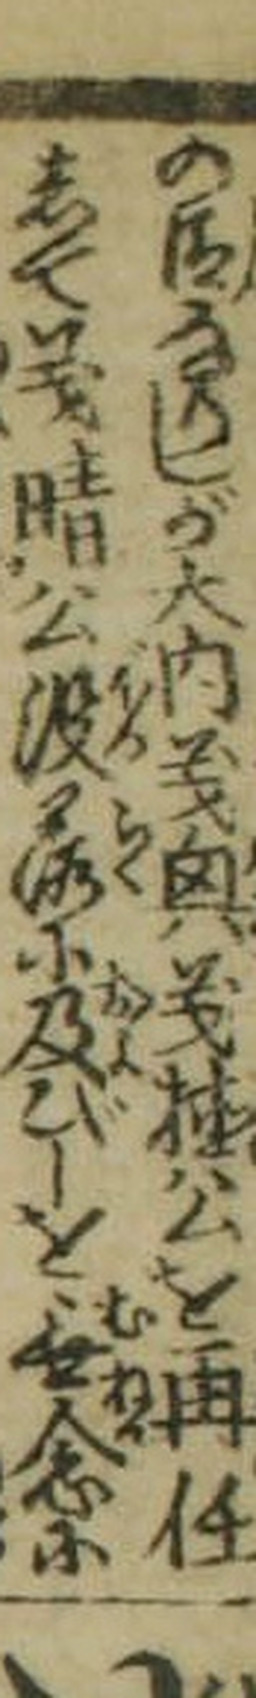して義晴公没落に及びしを無念に
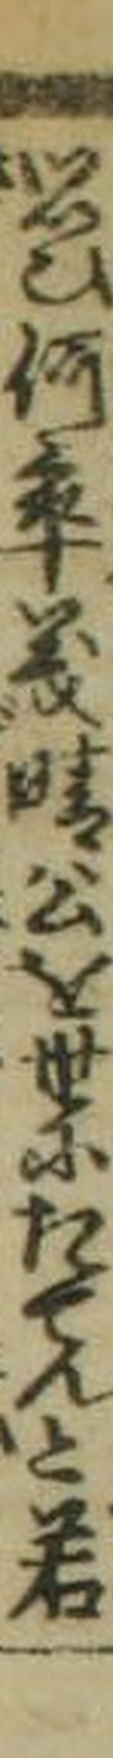思ひ何卒義晴公を世にたてんと若
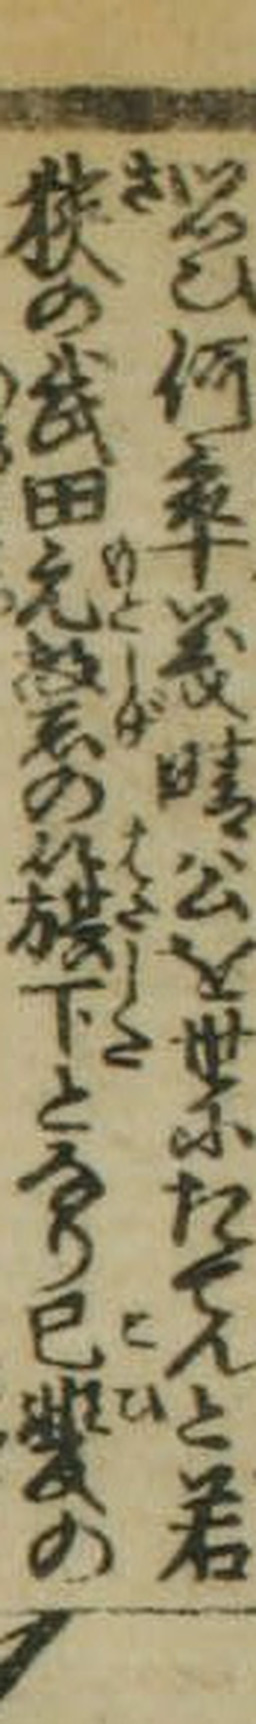狭の武田元繁の籏下となり己斐の
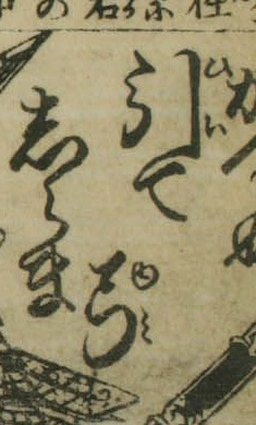しらま
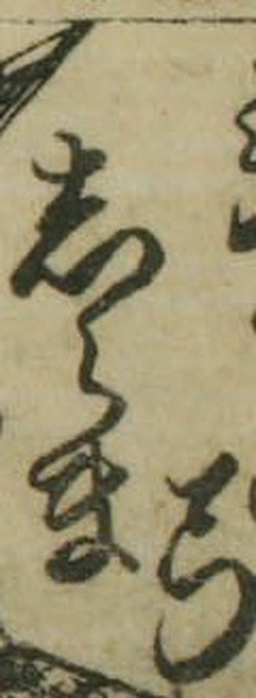しらま
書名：續英雄百人一首
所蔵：東京学芸大学附属図書館
